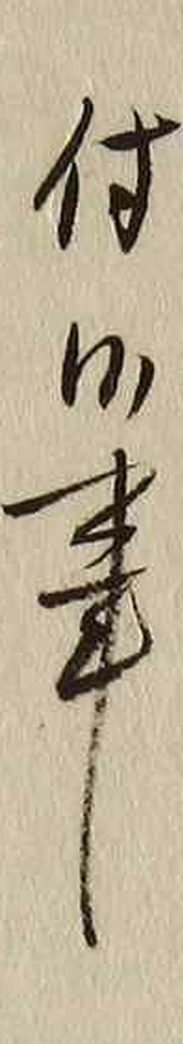付候事
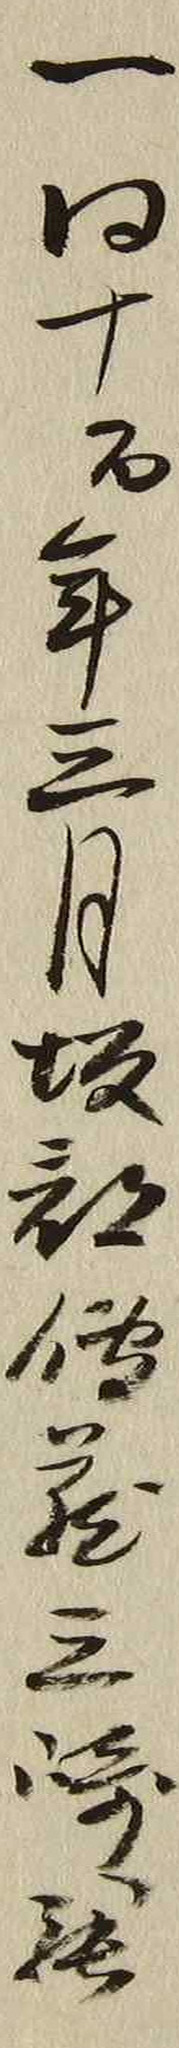一同十酉年三月坂部伝蔵三崎罷
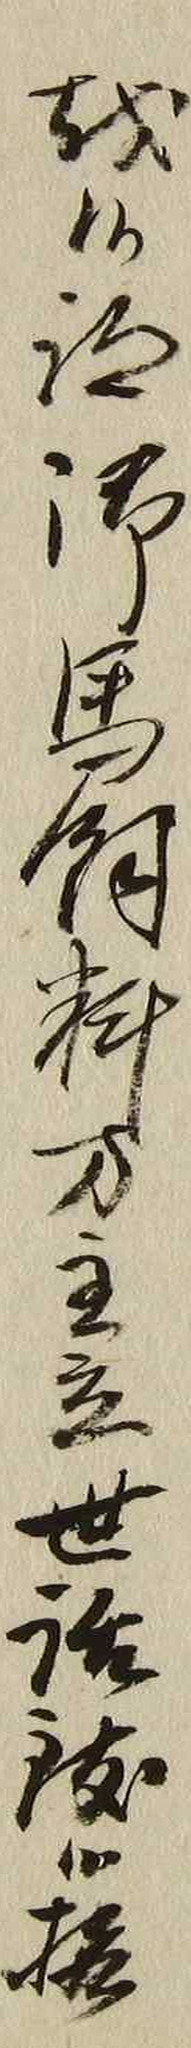越候跡御馬飼料方主立世話致候様
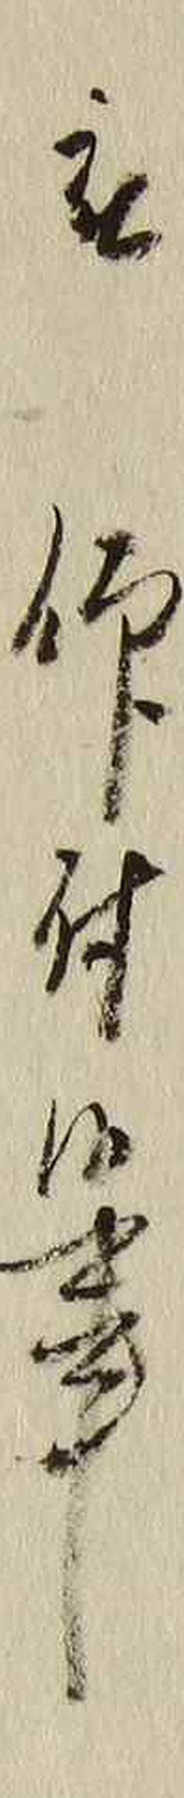被仰付候事
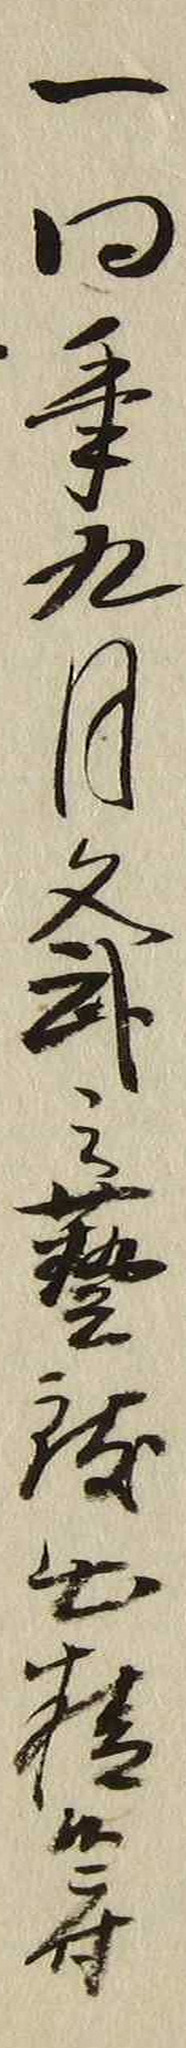一同年九月文武之芸致出精候付
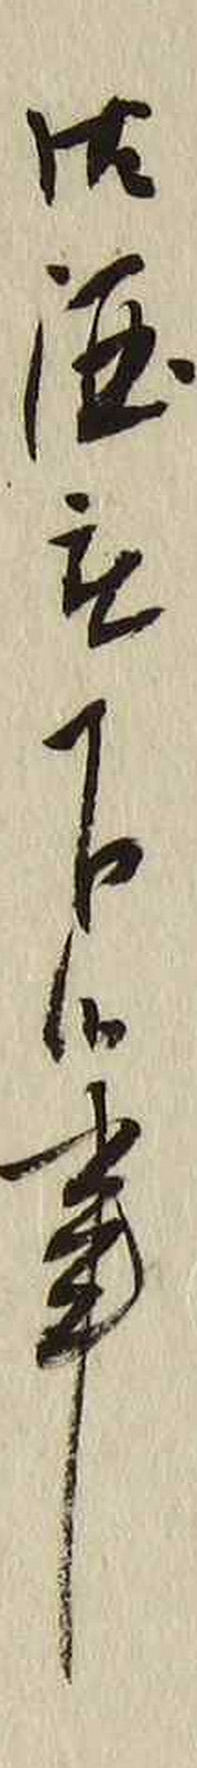御酒被下候事
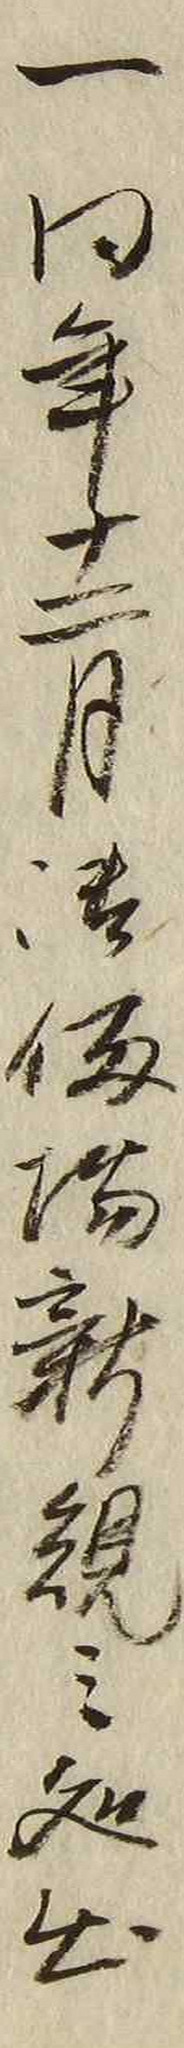一同年十二月御備場新規之処出
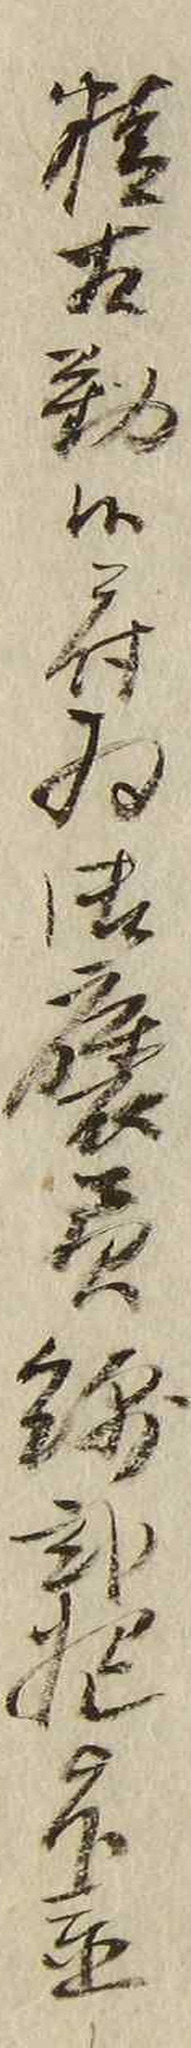精相勤候付為御褒美綿弐把被下置

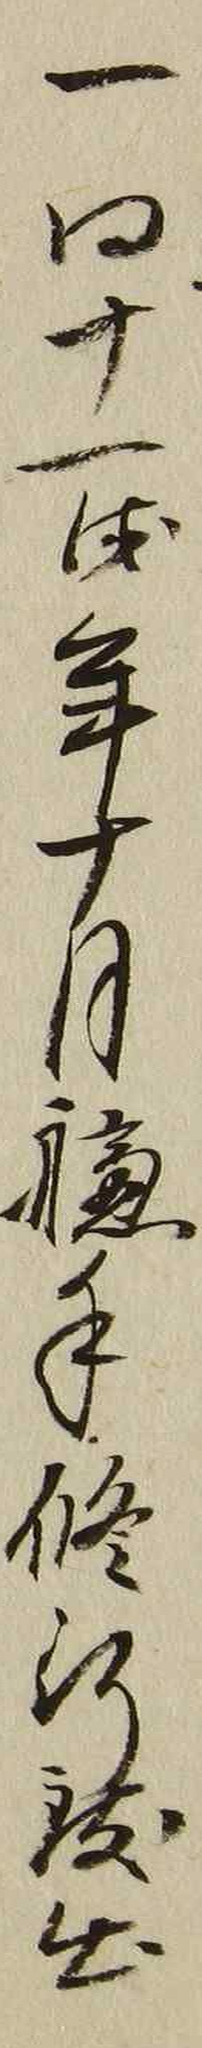一同十一戌年十月手修行致出
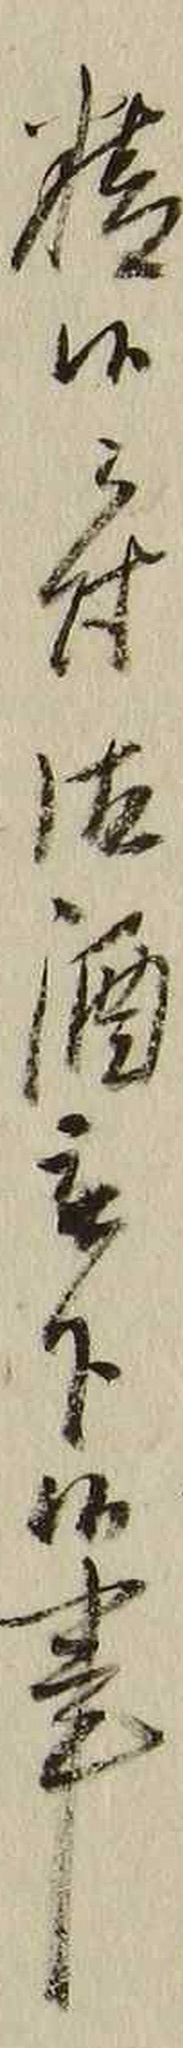精候付御酒被下候事
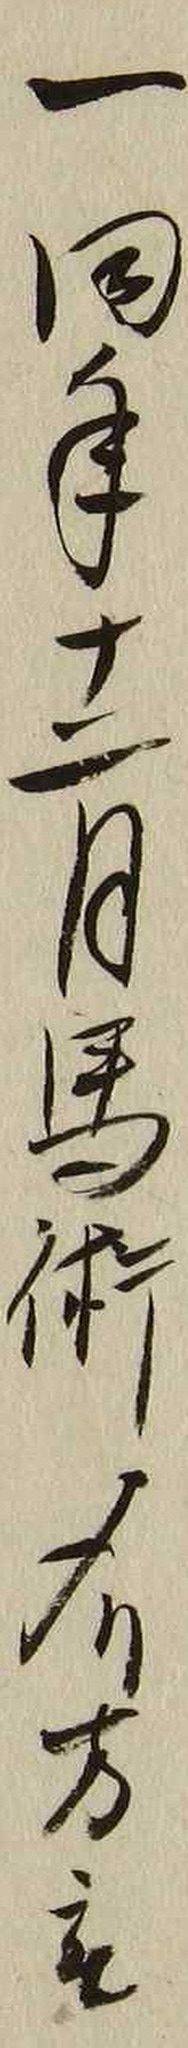一同年十二月馬術〆り方被
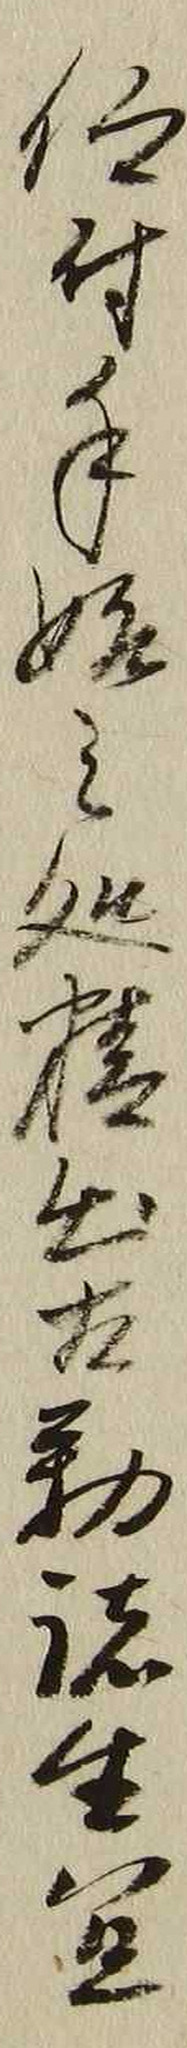仰付手始之処精出相勤諸生宜
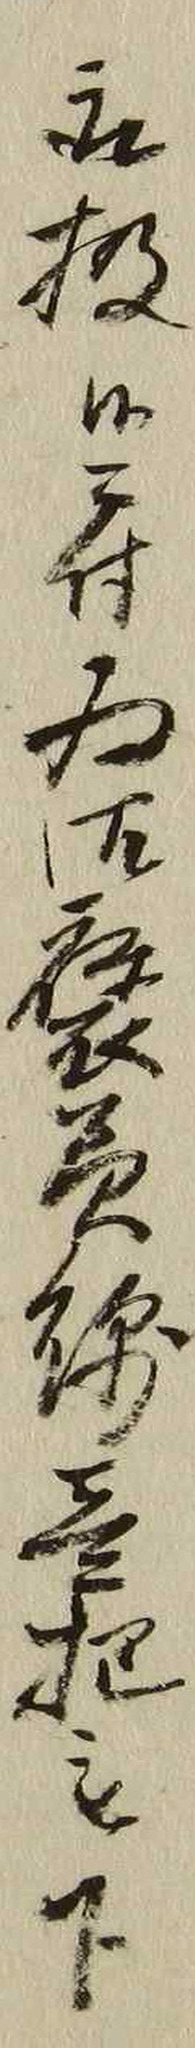取扱候付為御褒美綿壱把被下
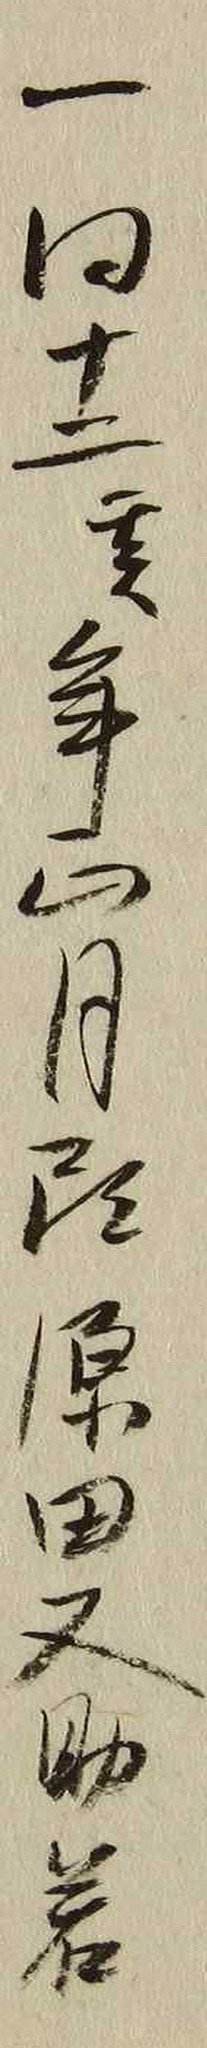一同十二亥年正月頭源田又助若
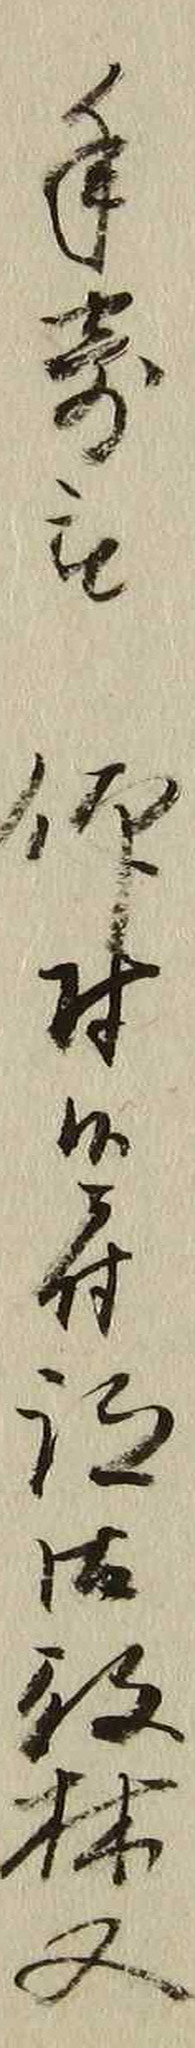年寄被仰付候付跡御役林又
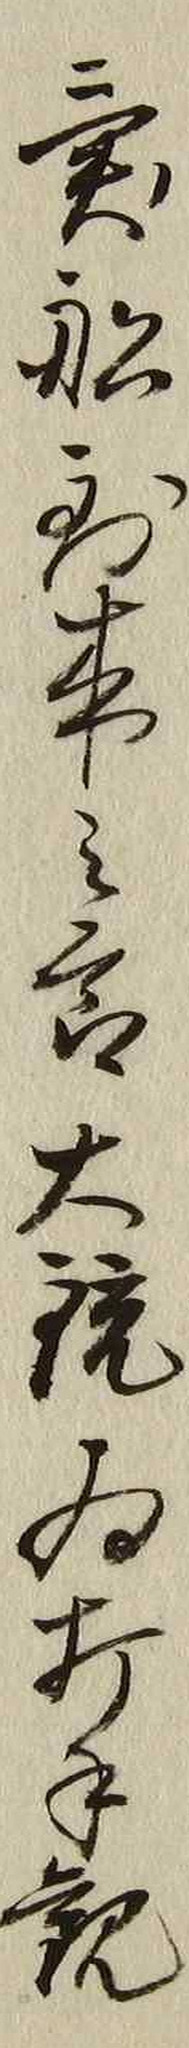異船到来之節大銃為打手観
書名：諸士系譜　巻之350　せ之部1冊全
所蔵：会津若松市立会津図書館
